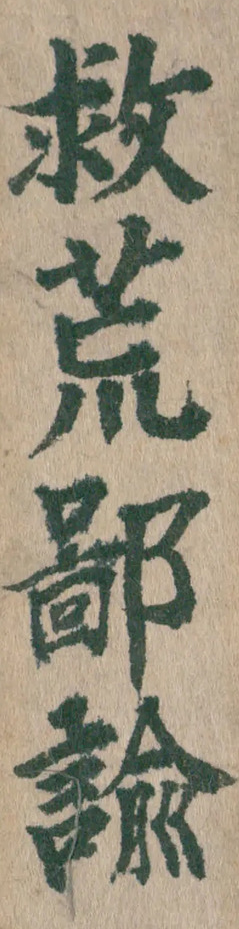救荒鄙諭

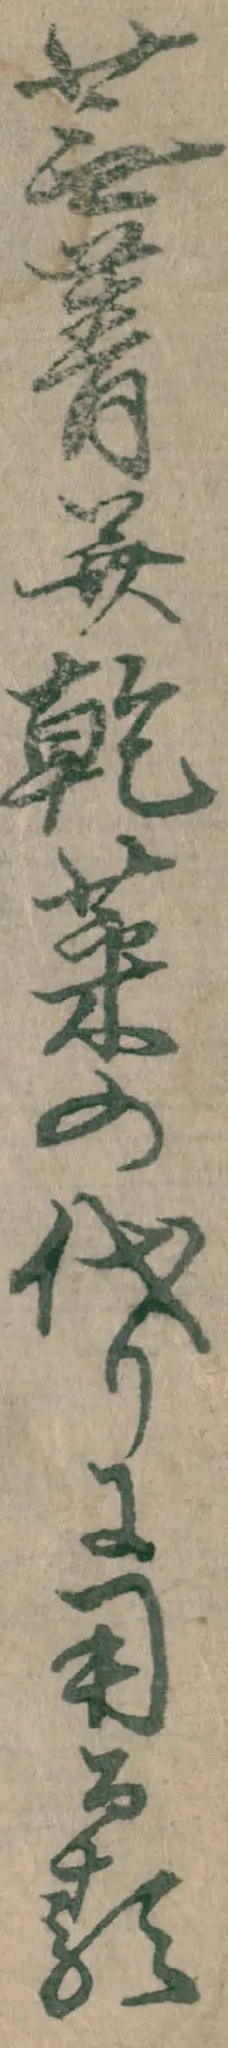蕪菁並乾菜の代りに用る類
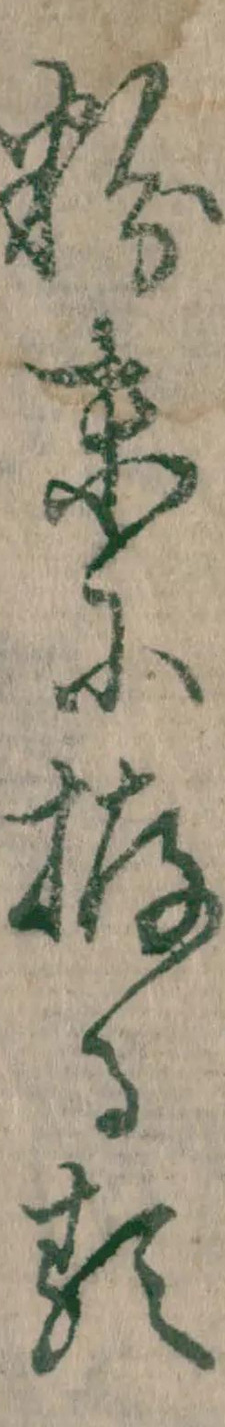粉末に拵る類
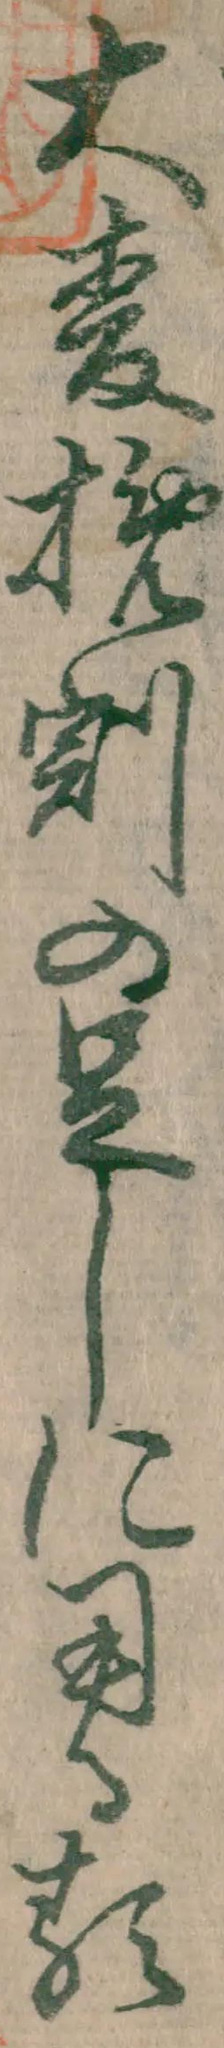大麦挽割の足しに用る類
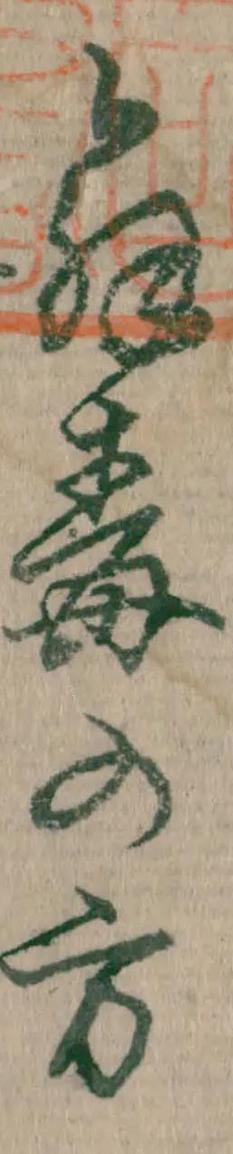解毒の方
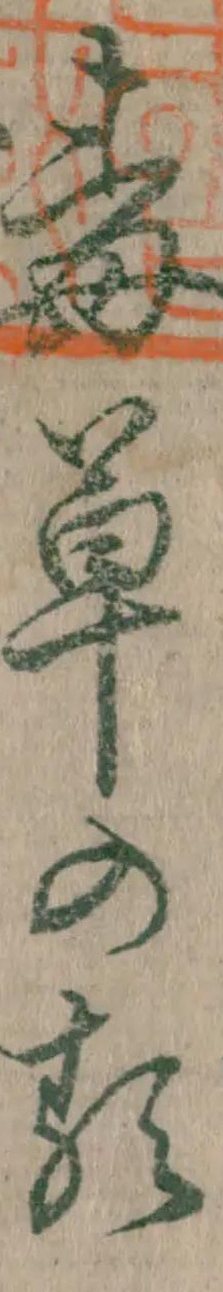毒草の類
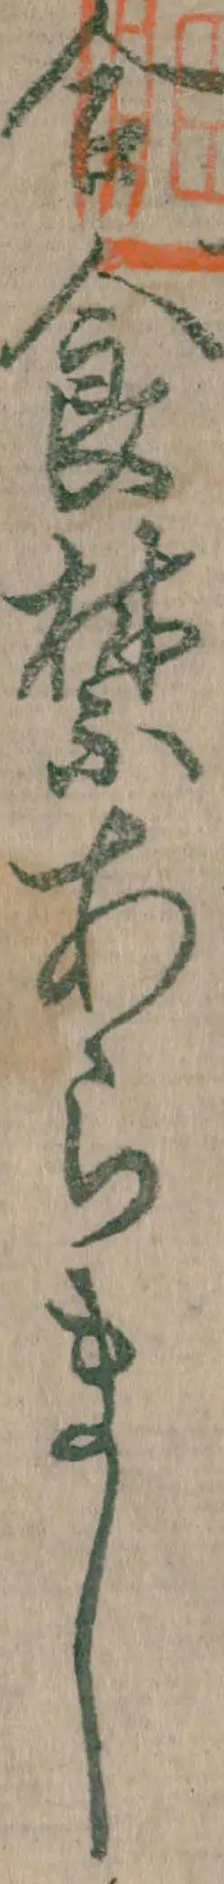合食禁あらまし
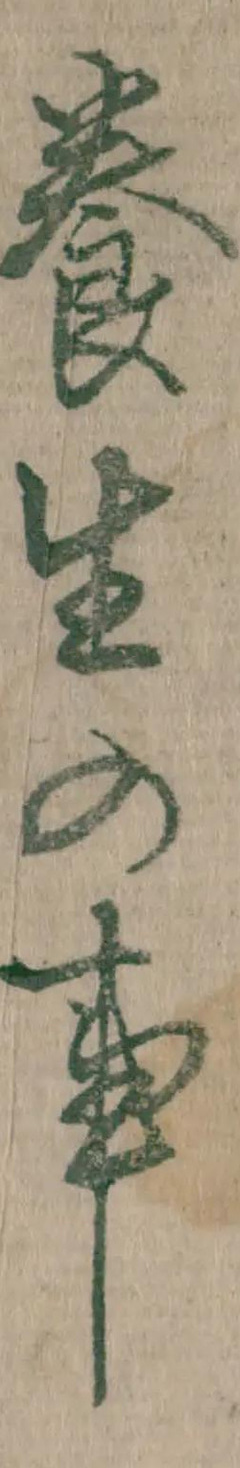養生の事
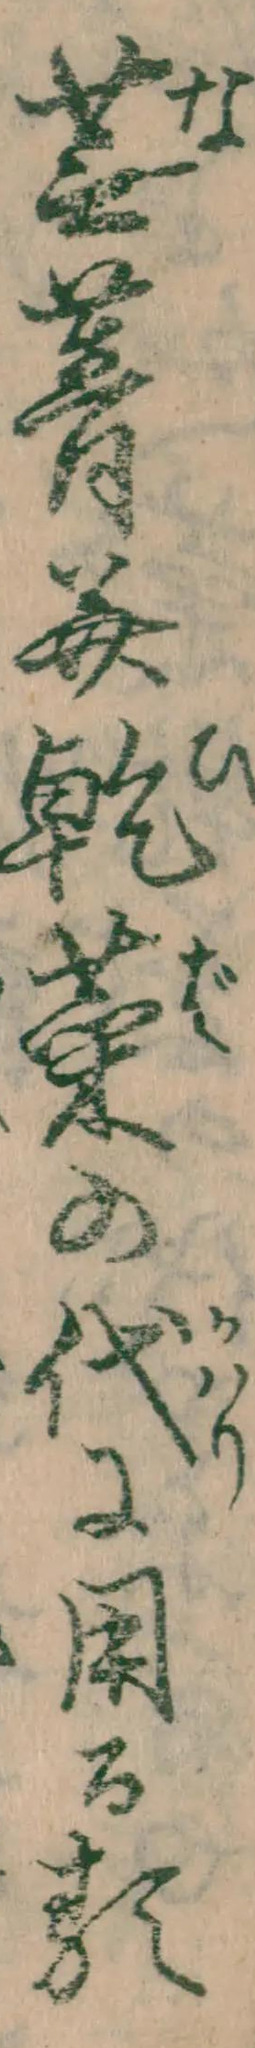蕪菁並乾菜の代りに用る類
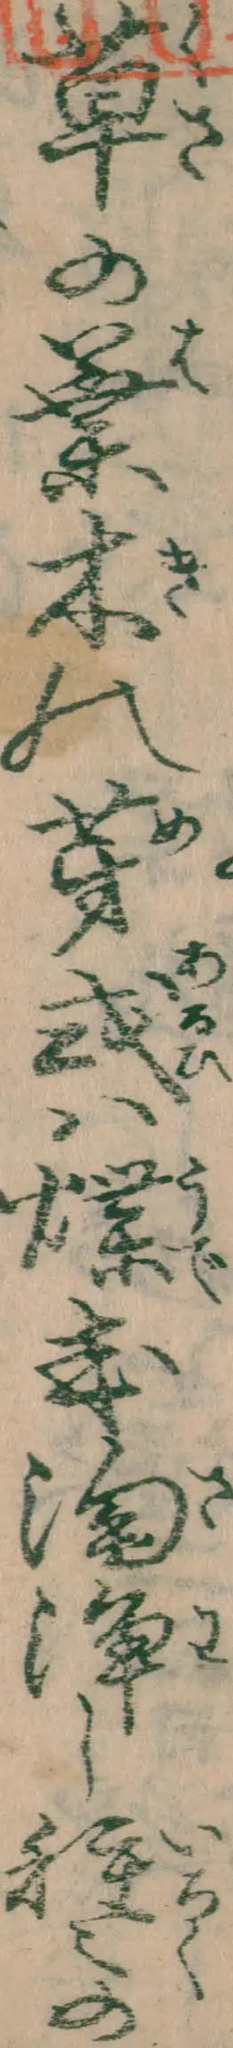草の葉木の芽或は爛出淘浄し種々の
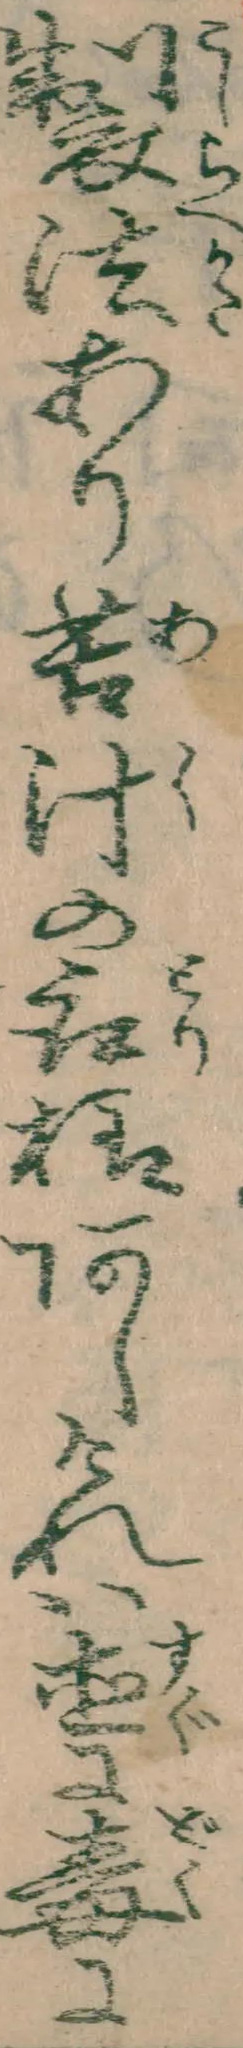製法あり苦汁の取様あしけれは直に毒に
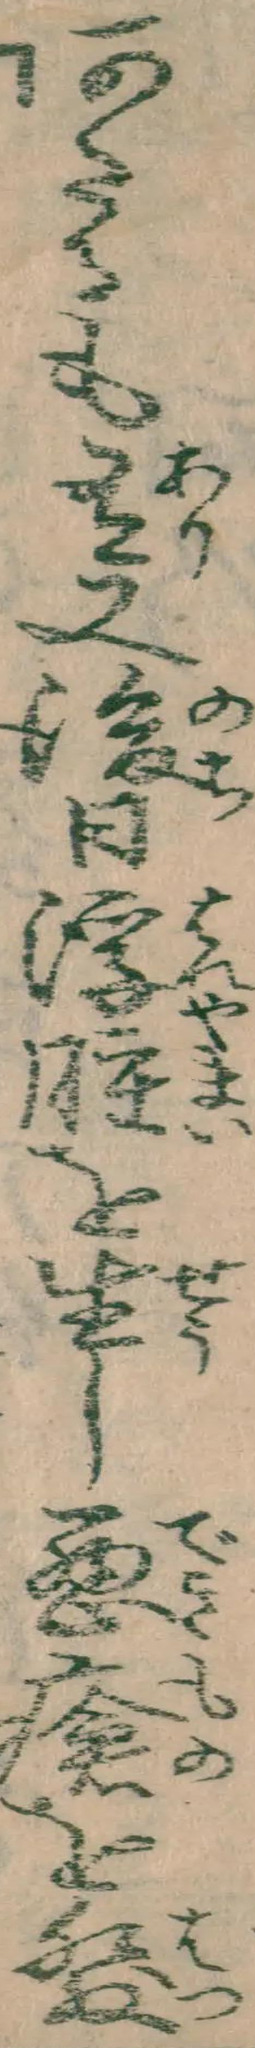あたるも有又後日浮腫を生し悪瘡を発
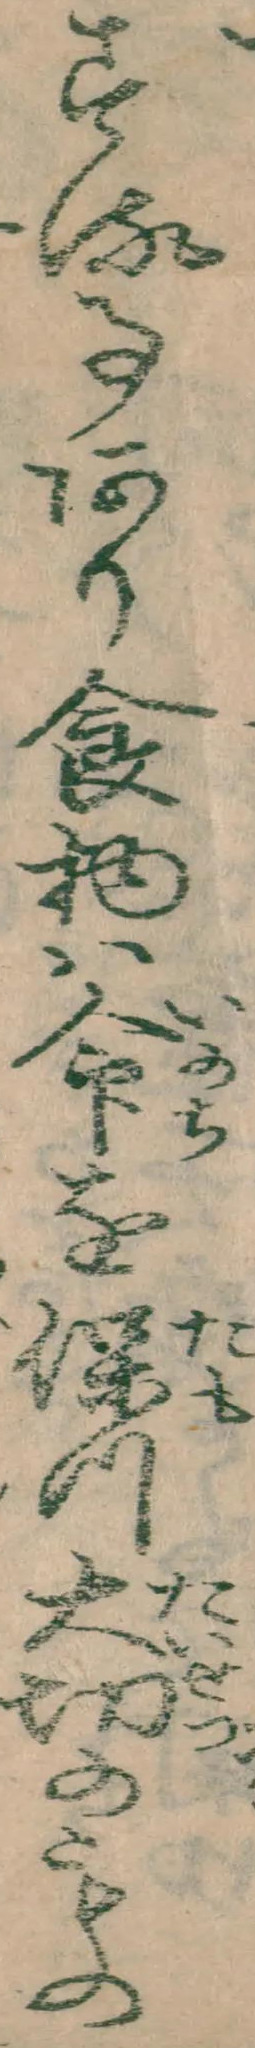する事あり食物は命を保つ大切のもの
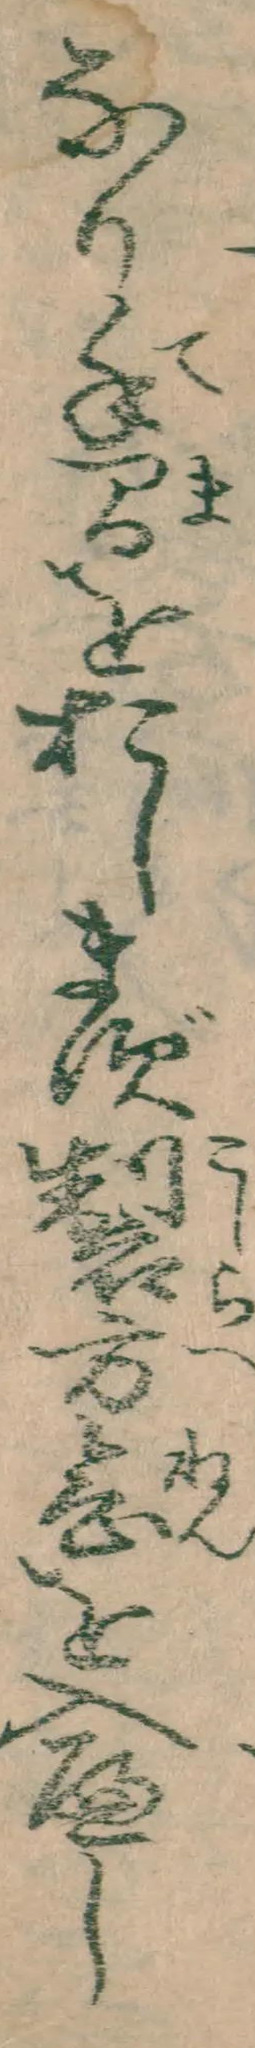なり手間をおしまず製方念を入べし
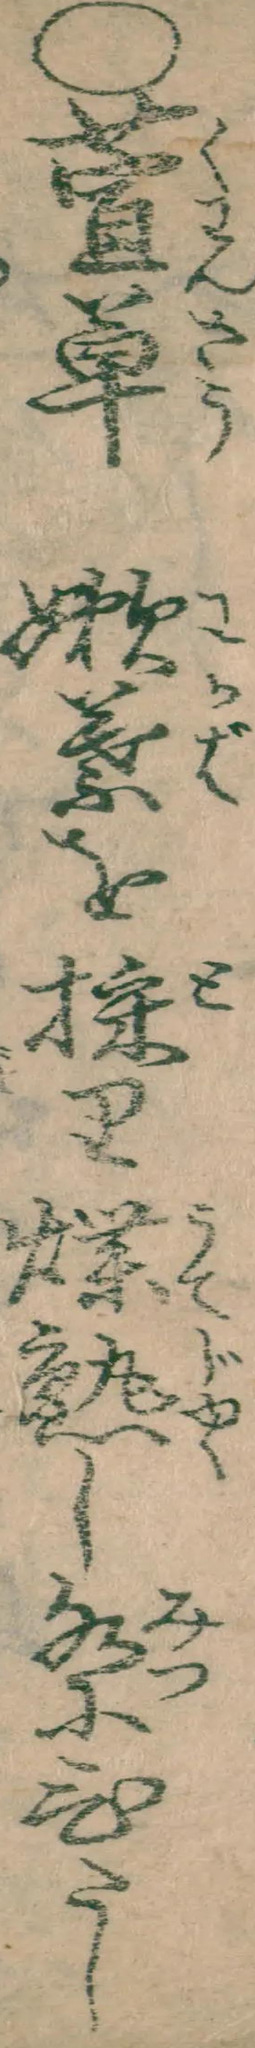〇萱草嫩葉を採り爛熟し水にひたし
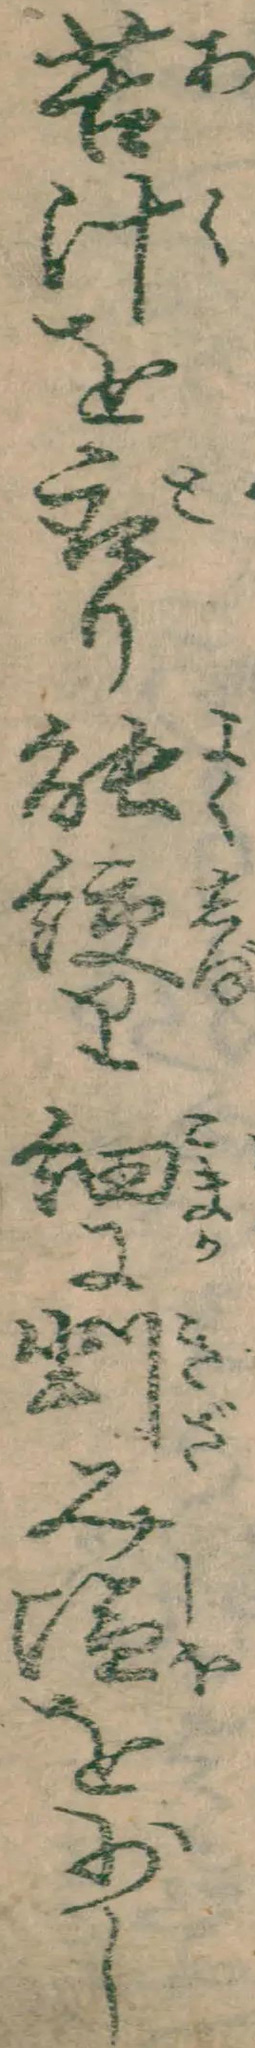苦汁を取り能絞り細に刻み塩を少し
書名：救荒鄙諭
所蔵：国立国会図書館 National Diet Library, JAPAN
